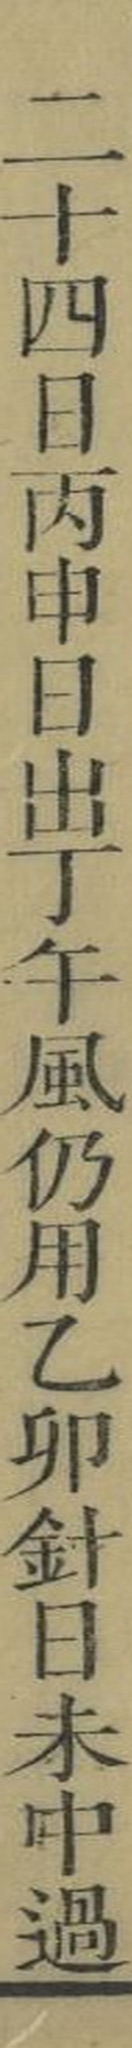二十四日丙申日出丁午風仍用乙卯針日未中過
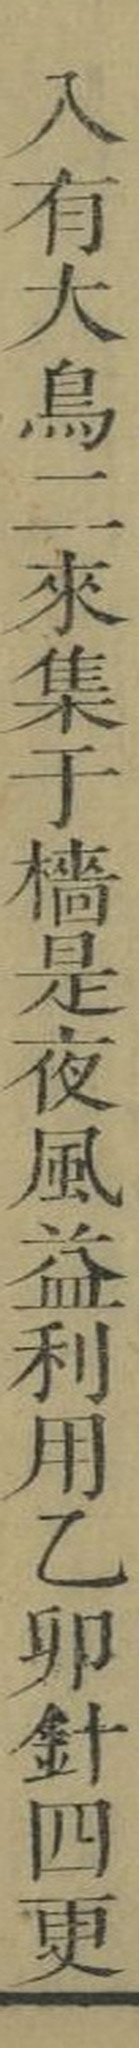入有大鳥二來集于檣是夜風益利用乙卯針四更
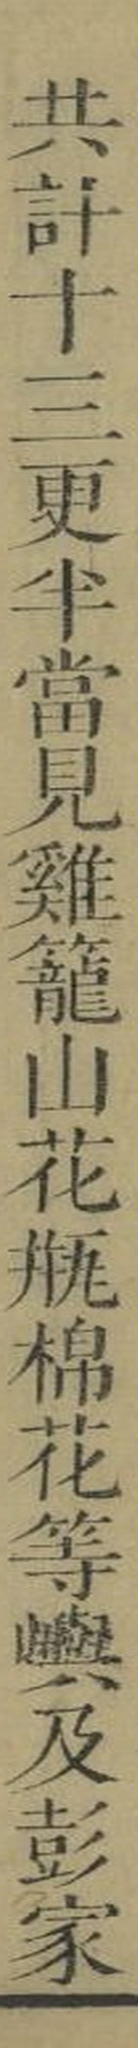共計十三更半當見雞籠山花瓶棉花等嶼及彭家
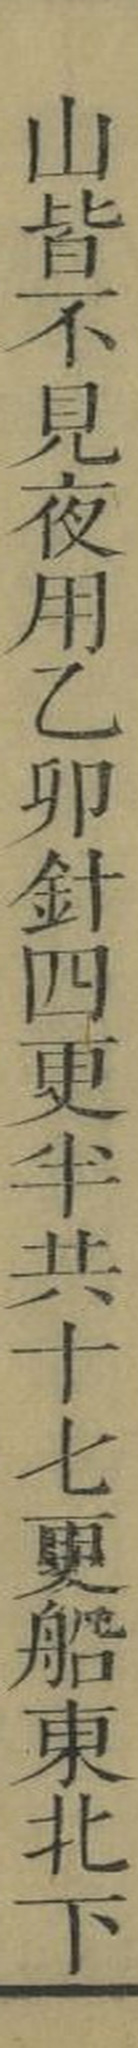山皆不見夜用乙卯針四更半共十七更船東北下

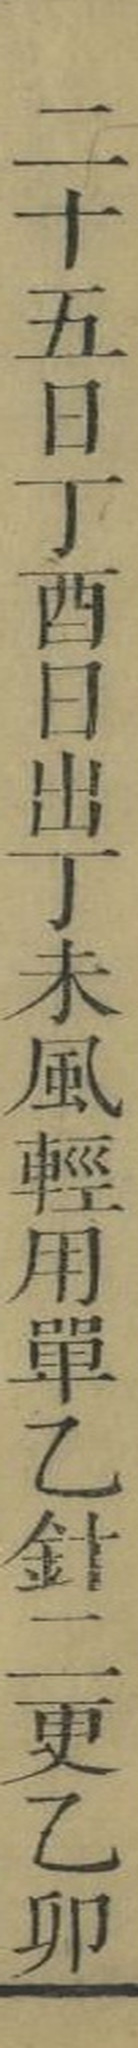二十五日丁酉日出丁未風輕用單乙針二更乙卯
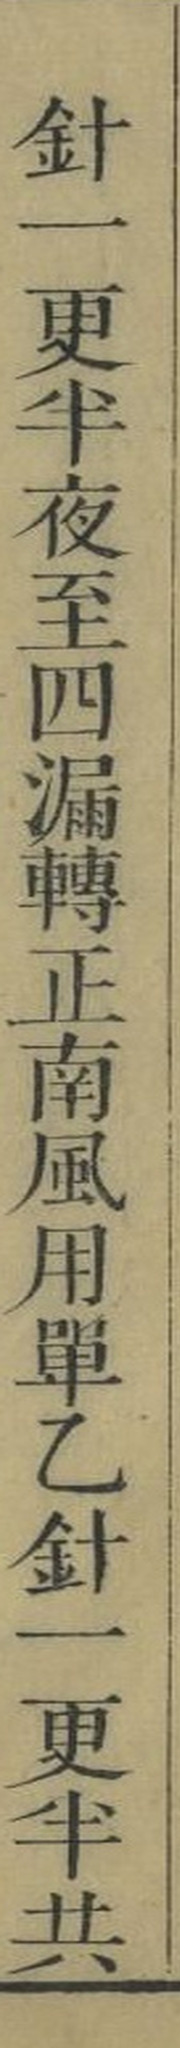針一更半夜至四漏轉正南風用單乙針一更半共
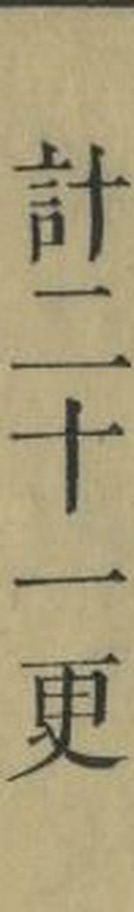計二十一更
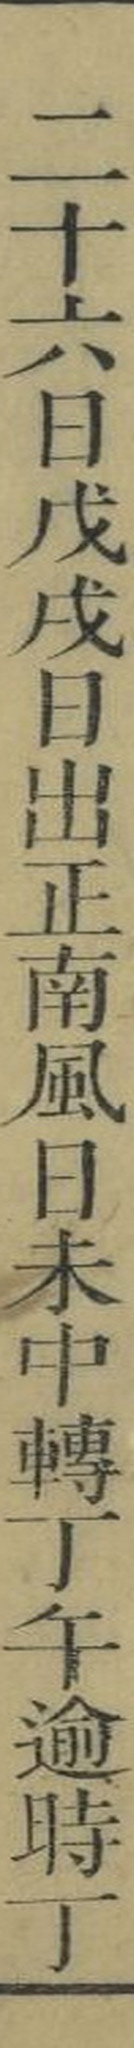二十六日戊戌日出正南風日未中轉丁午逾時丁
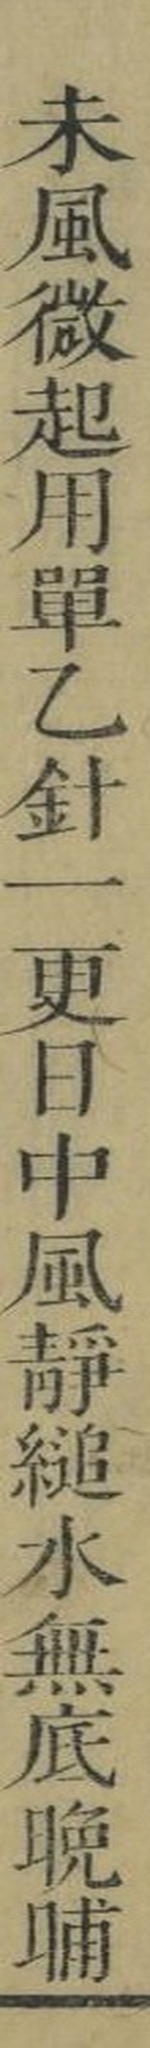未風微起用單乙針一更日中風靜縋水無底晩晡
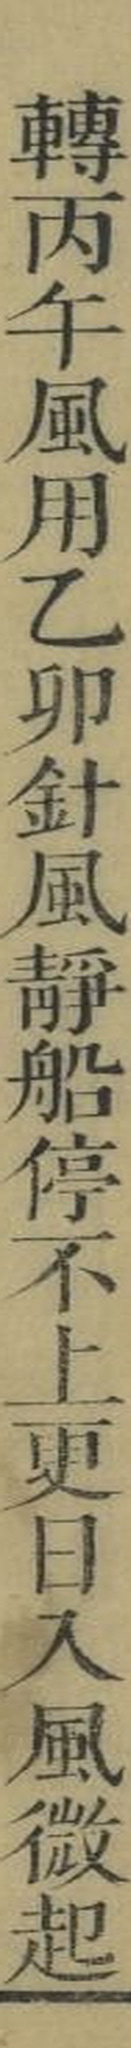轉丙午風用乙卯針風靜船停不上更日入風微起
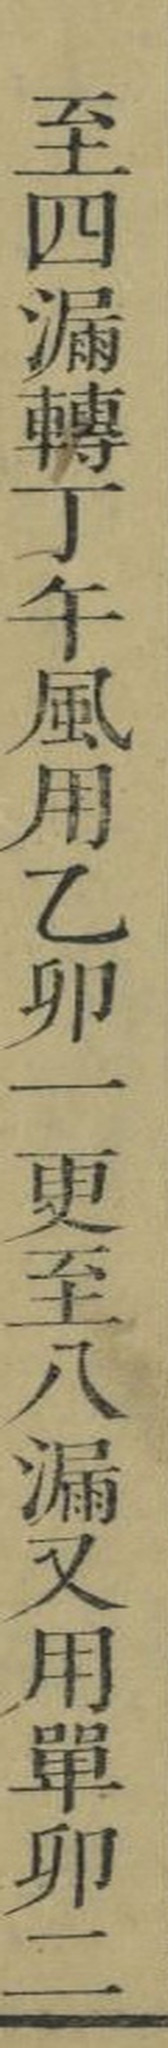至四漏轉丁午風用乙卯一更至八漏又用單卯二
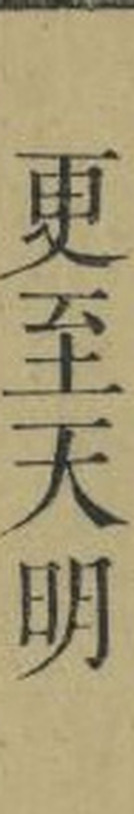更至天明
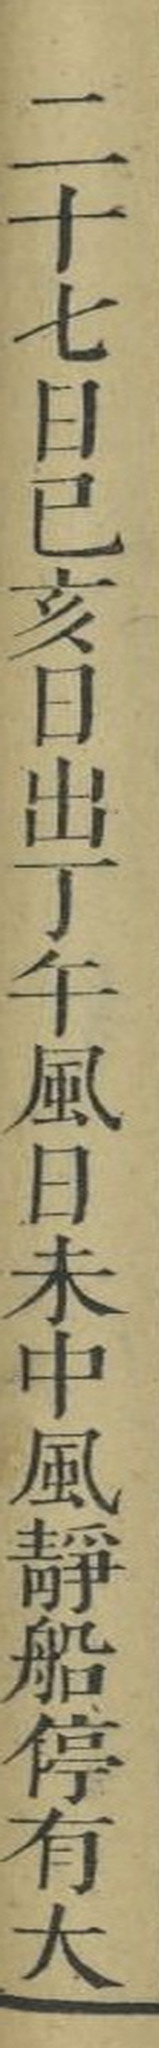二十七日巳亥日出丁午風日未中風靜船停有大
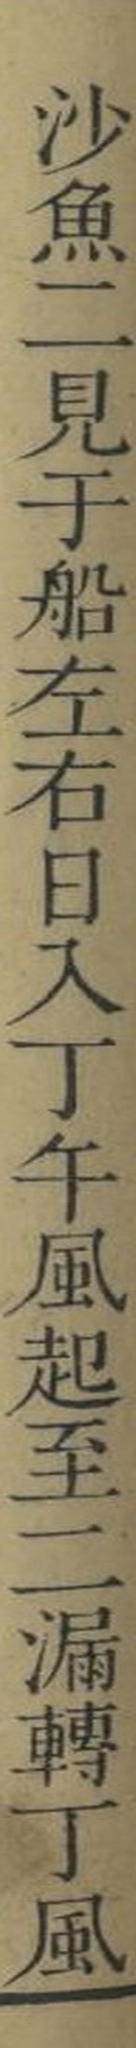沙魚二見于船左右日入丁午風起至二漏轉丁風
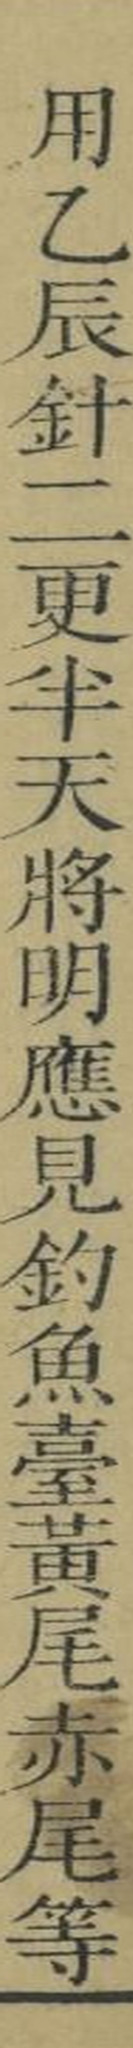用乙辰針二更半天將明應見釣魚臺黃尾赤尾等
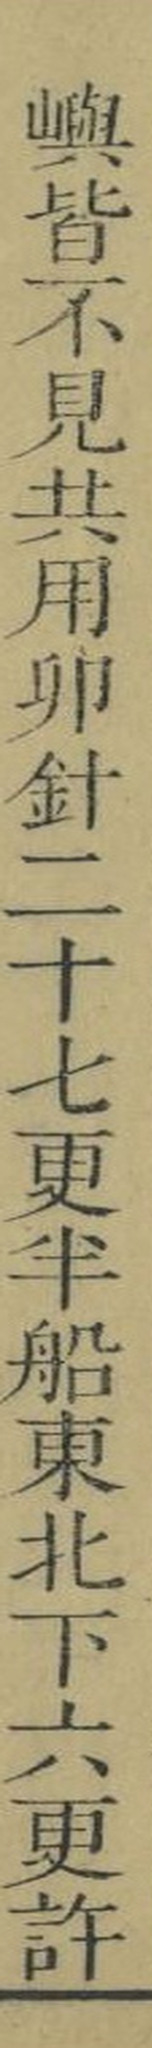嶼皆不見共用卯針二十七更半船東北下六更許
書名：中山伝信録 巻一
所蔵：University of the Ryukyus Library
